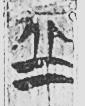丘
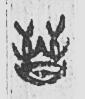晉
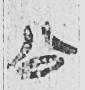公
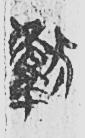獻
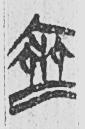齊
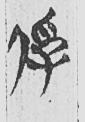俘
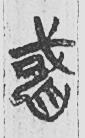馘
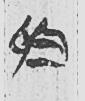於
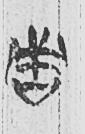周
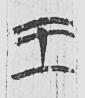王
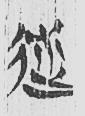述
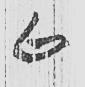㠯（以）
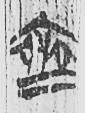齊
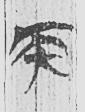侯
